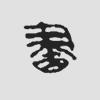晝
